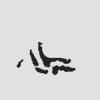乍
